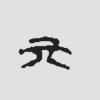亓（其）
